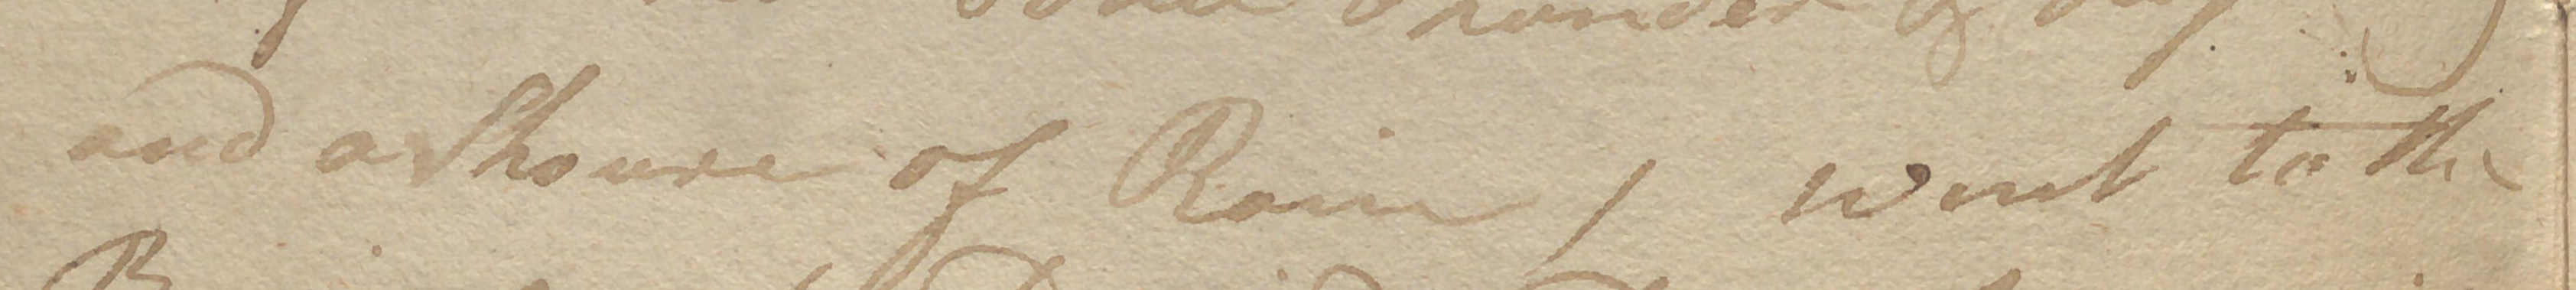and a Shoure of Rain, went to the
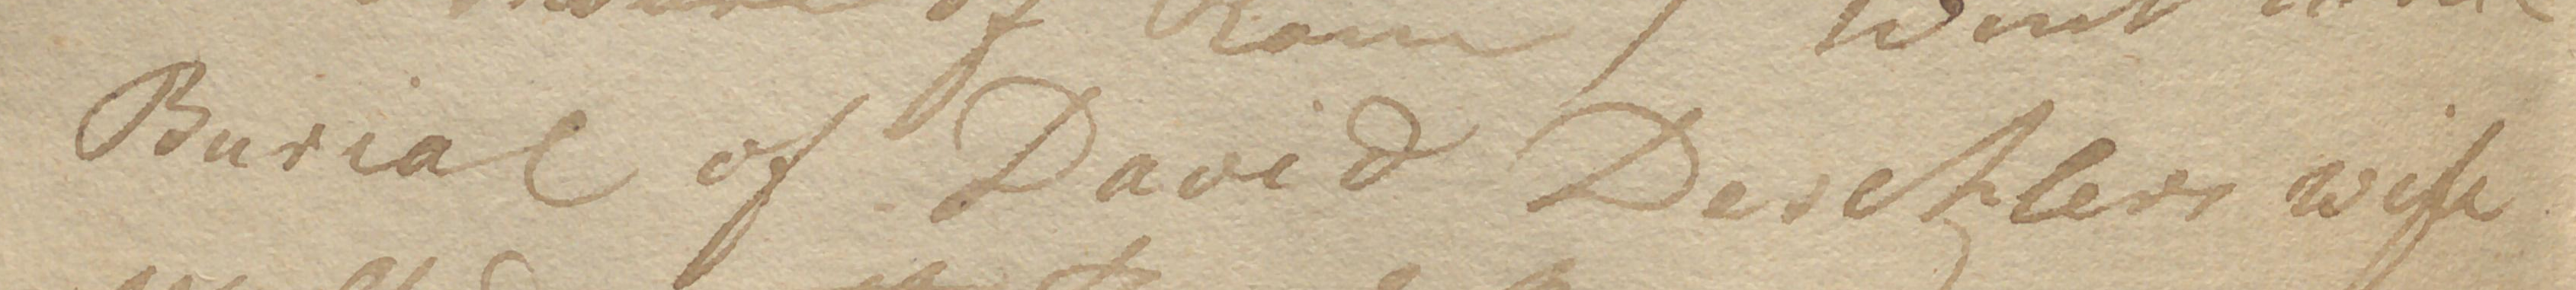Burial of David Deschlers wife
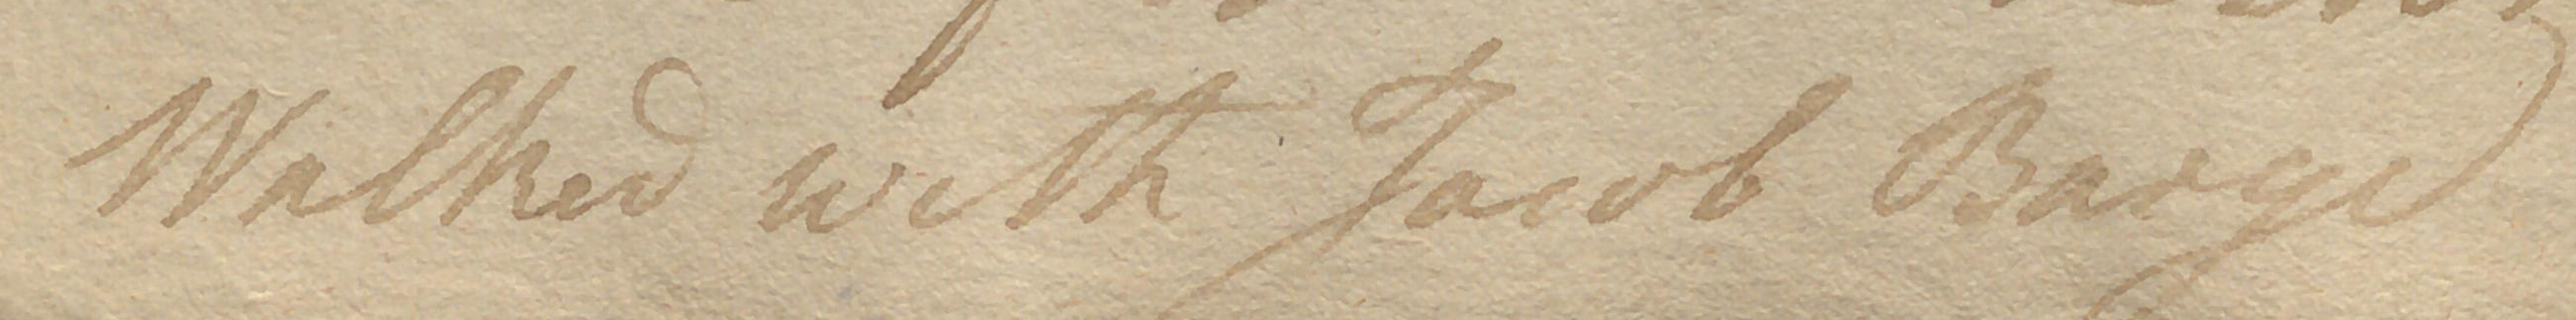Walker with Jacob Barge
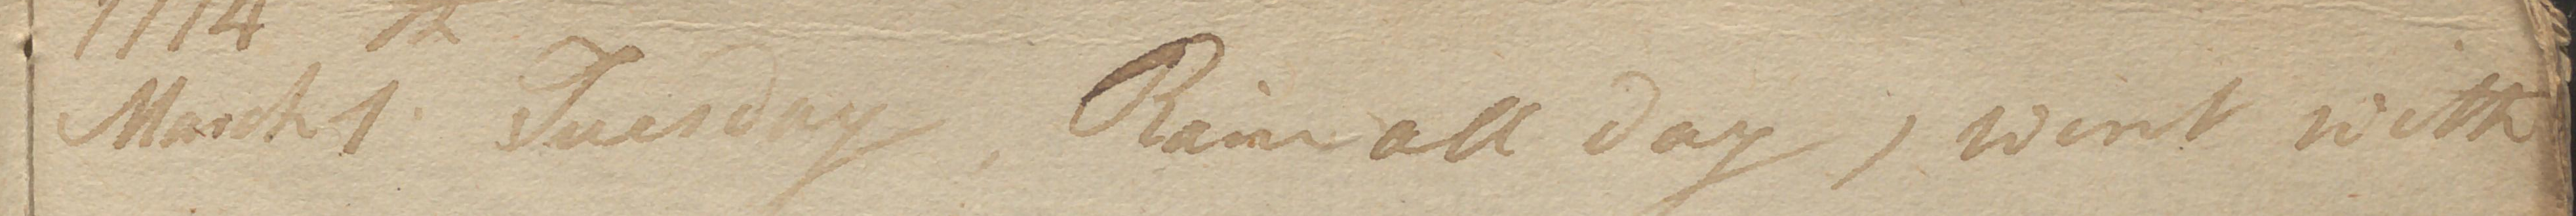March 1^th Tuesday Rain all day, went with
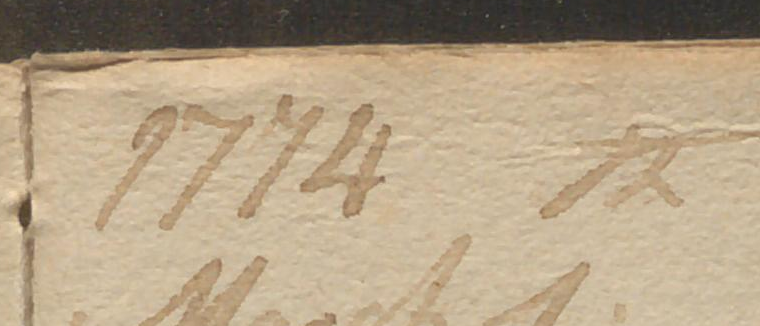1774
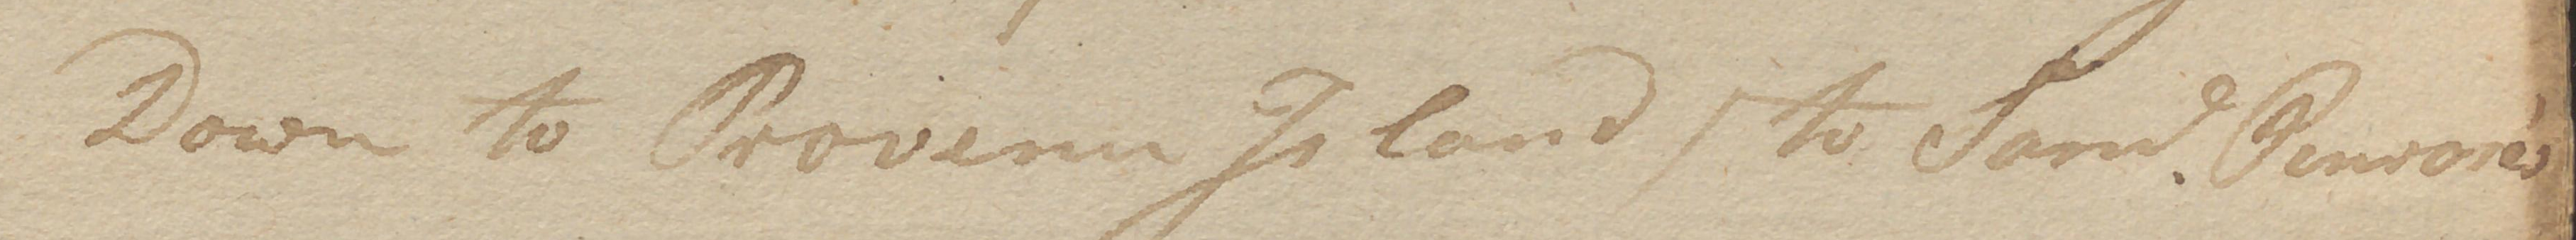Down to Province Island to Sam^l. Penrose
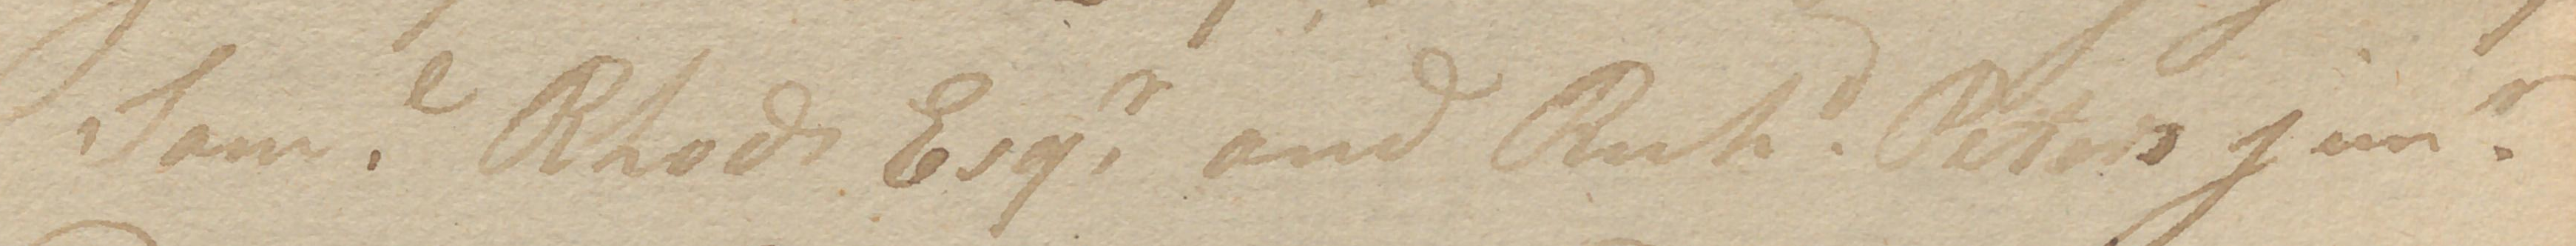Sam^l. Rhods Esq^r. and Rich^d. Peters jun^r.
